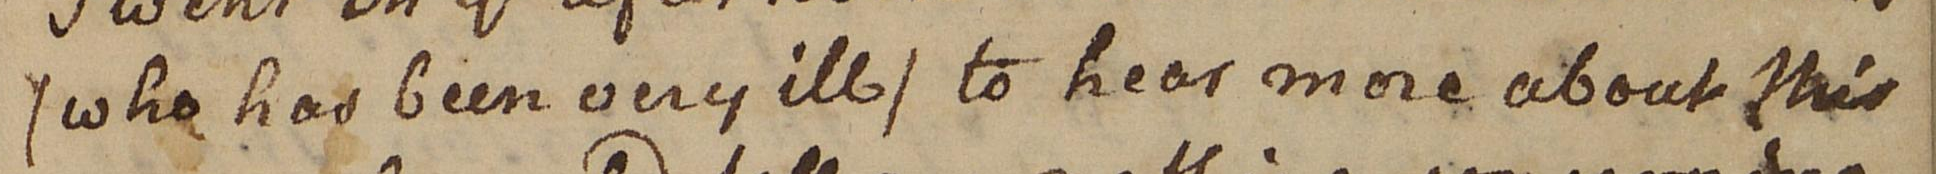/who has been very ill/ to hear more about this
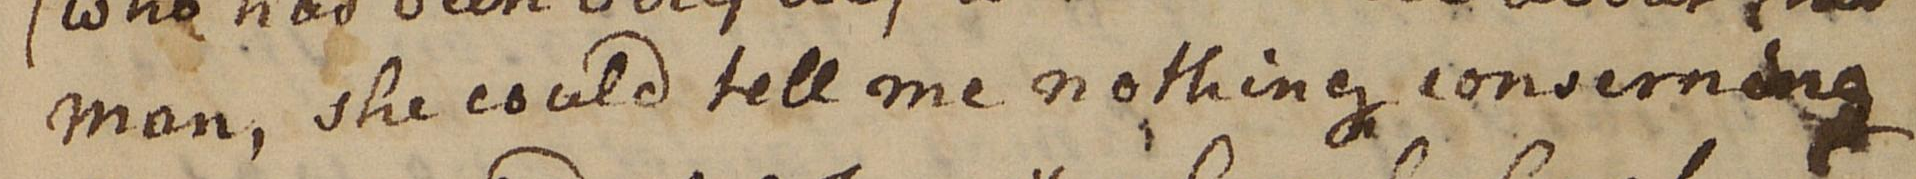man, she could tell me nothing conserning
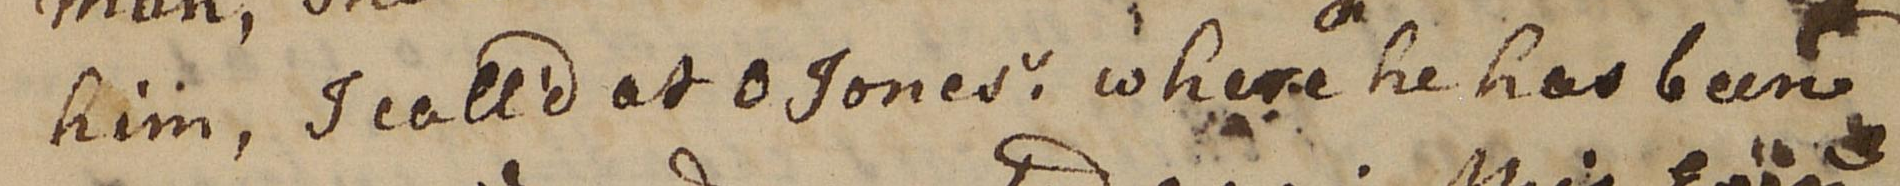him, I call'd at O Jones^s. where he has been
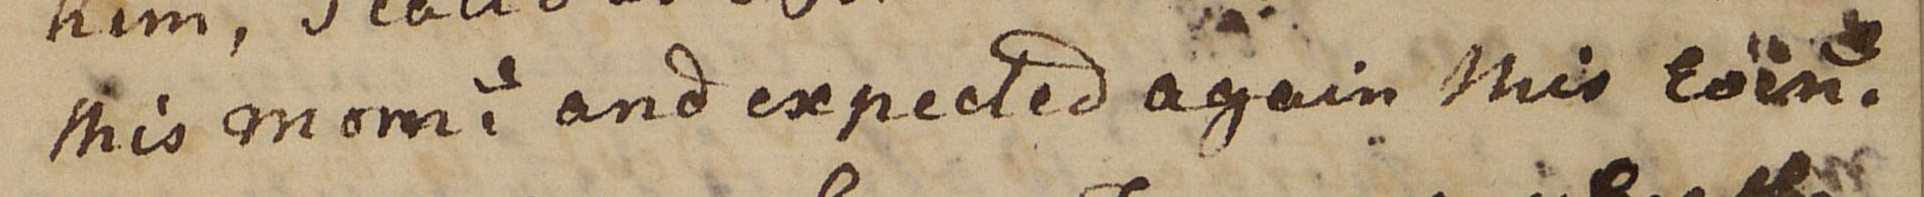this morn^g. and expected again this Even^g.
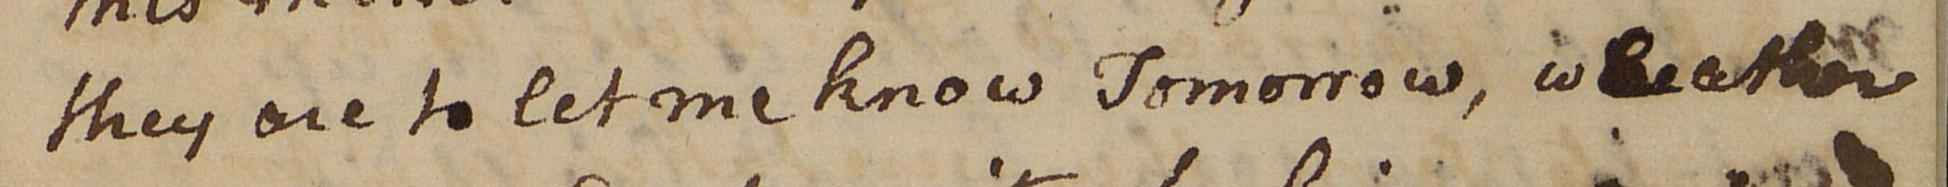they are to let me know Tomorrow, wheather
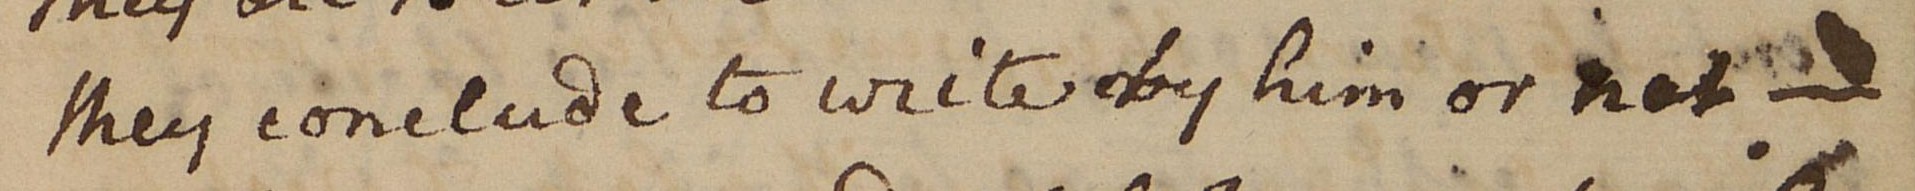they conclude to write by him or not-
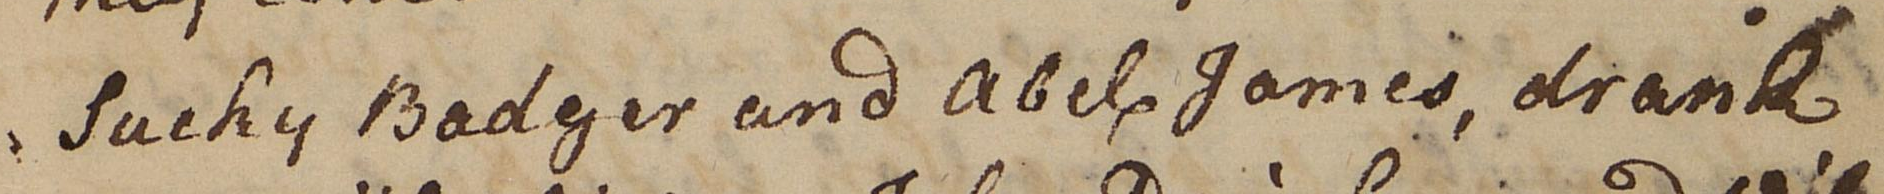Sucky Badger and Abel James, drank
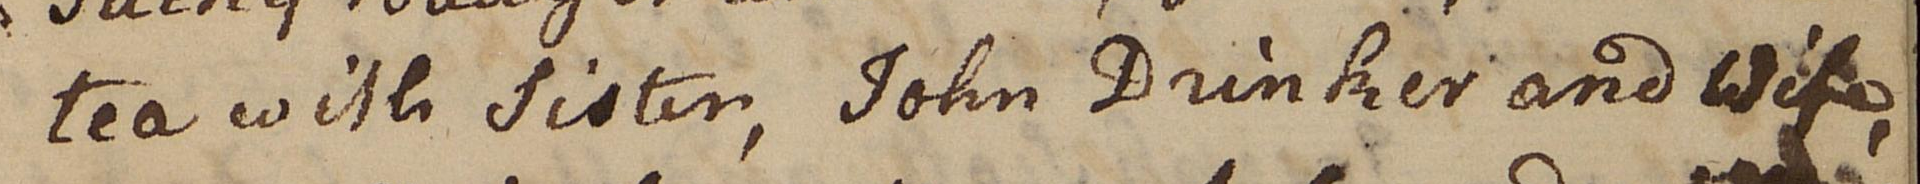tea withs Sister, John Drinker and Wife
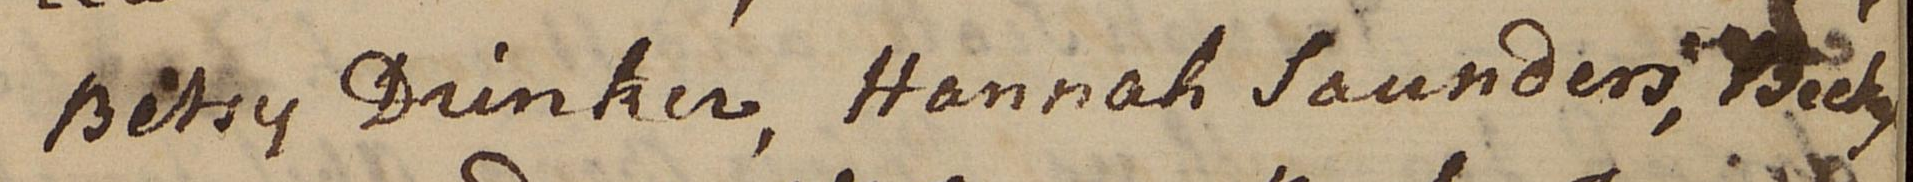Betsy Drinker, Hannah Saunders, Becky
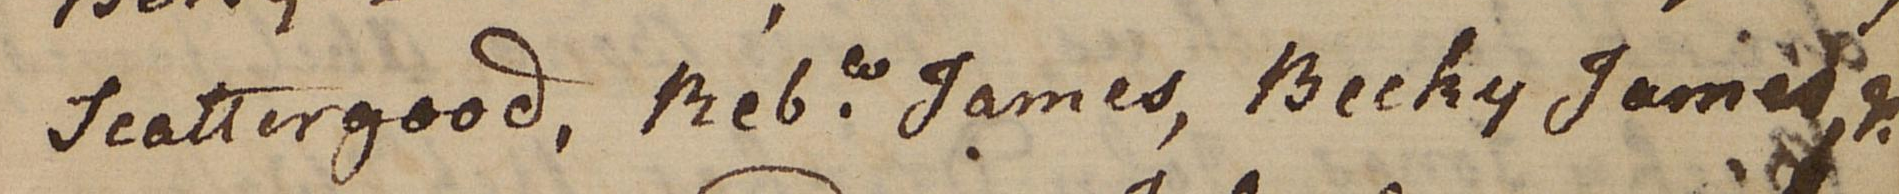Scattergood, Reb^a. James, Becky James
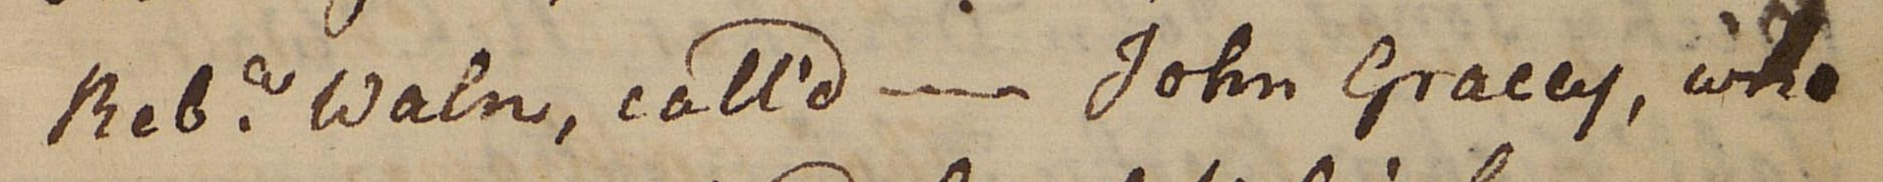Reb^a. Waln, call'd- John Gracey, who
